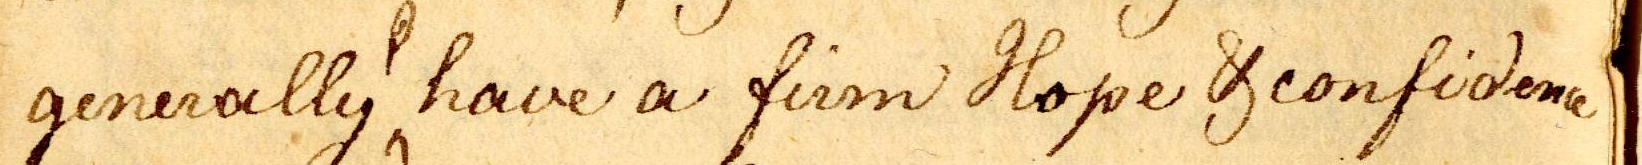generally ^I have a firm Hope & confidence
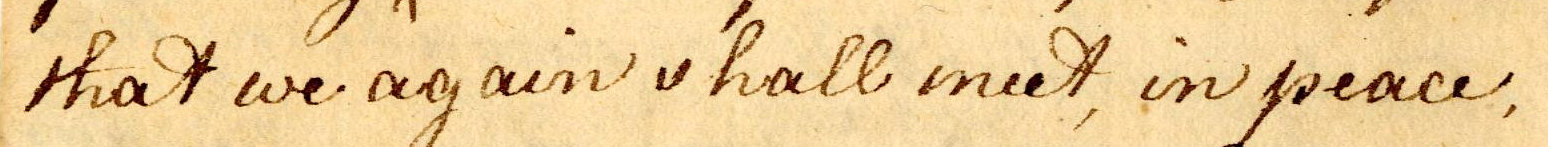that we again shall meet, in peace
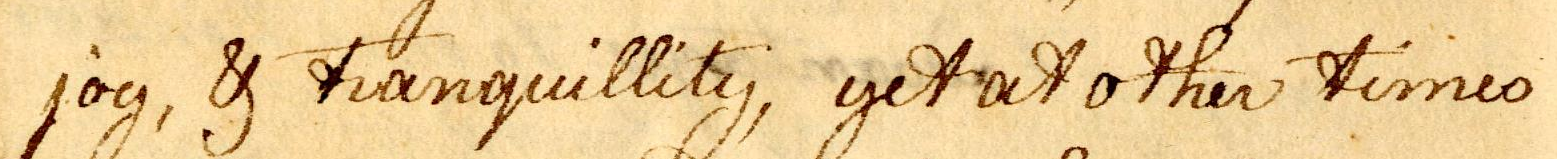joy, & tranquillity, yet at other times
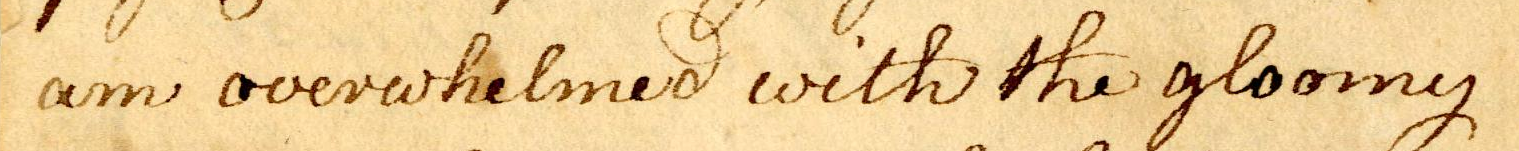am overwhelmed with the gloomy
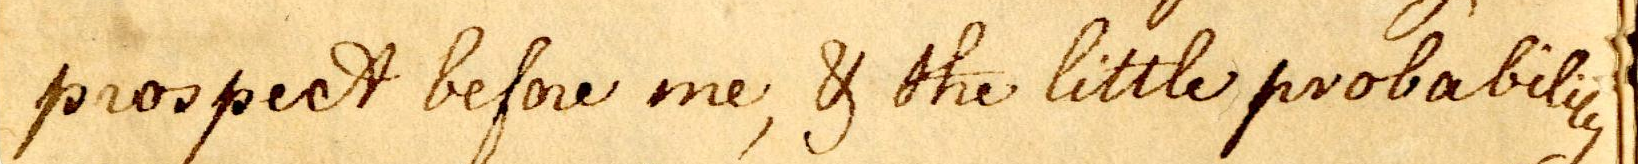prospect before me & the little probability
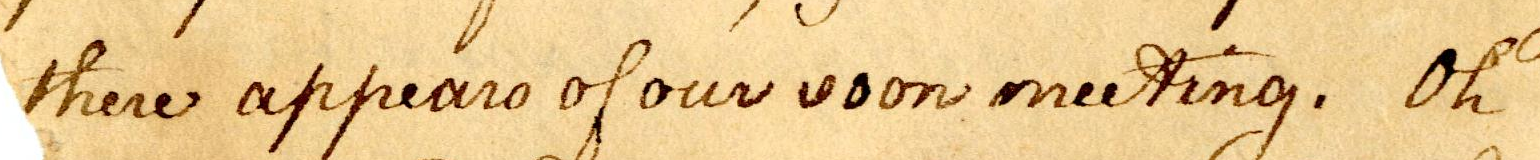there appears of our soon meeting. Oh
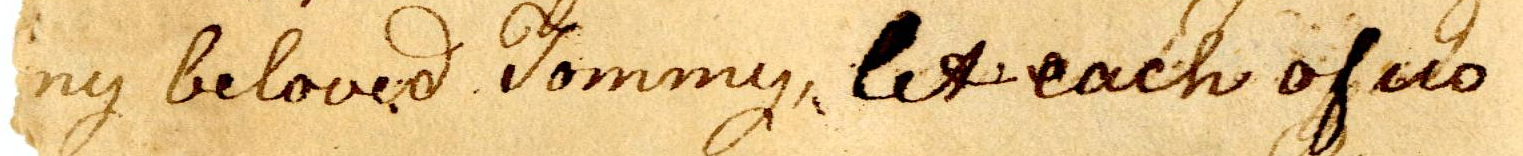my beloved Tommy, let each of us
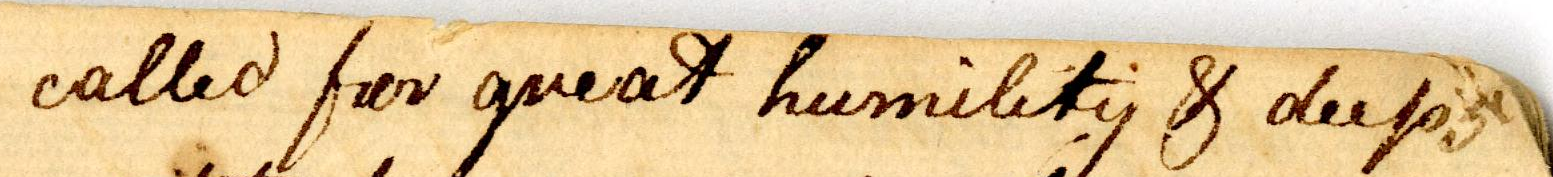called for great humility & deep 5
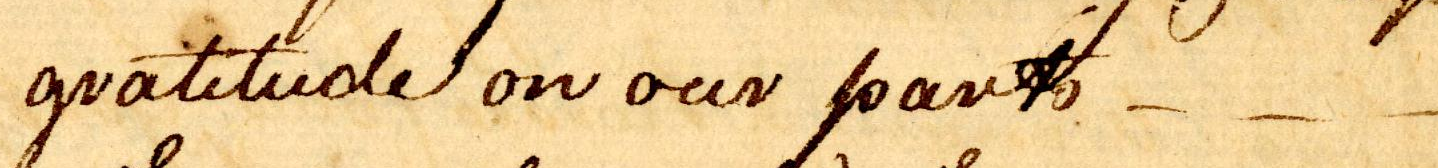gratitude on our parts-
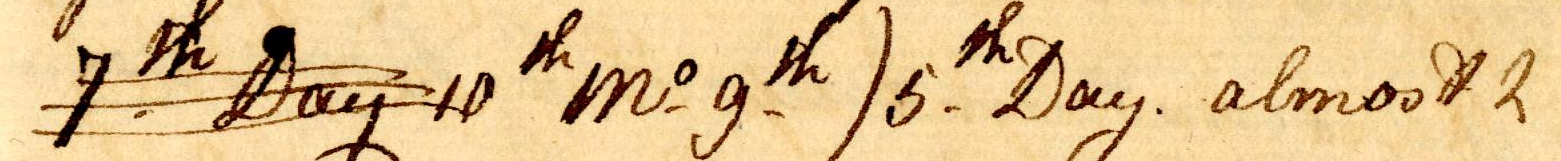[7^th Day] 10^th M^o 9^th ) 5^th Day. almost 2
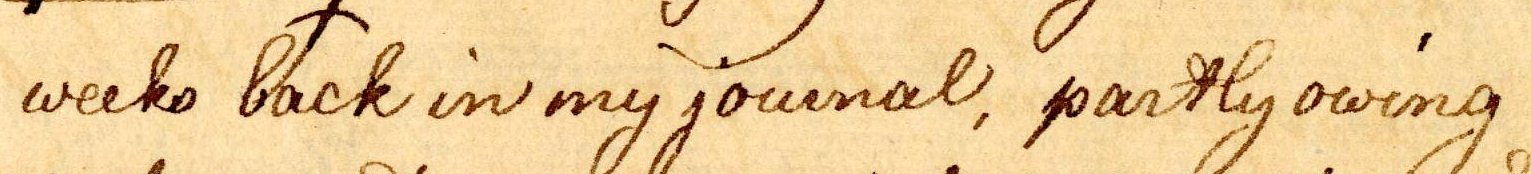weeks back in my journal, partly owing
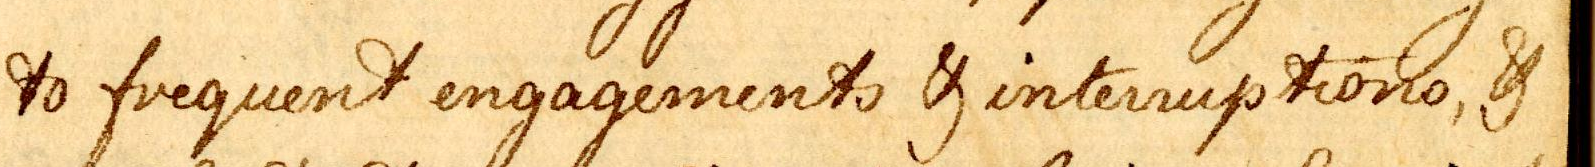to frequent engagements & interruptions &
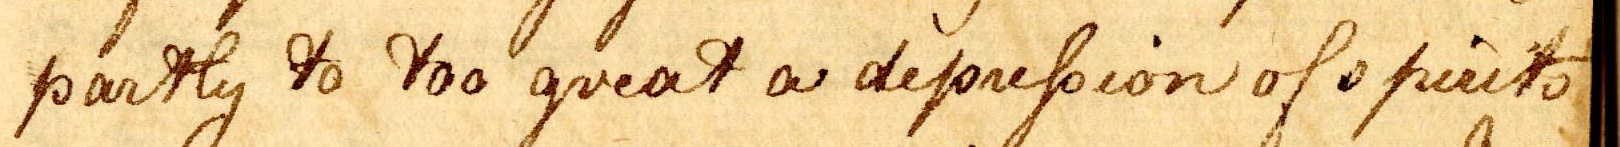partly to too great a depression of spirits
